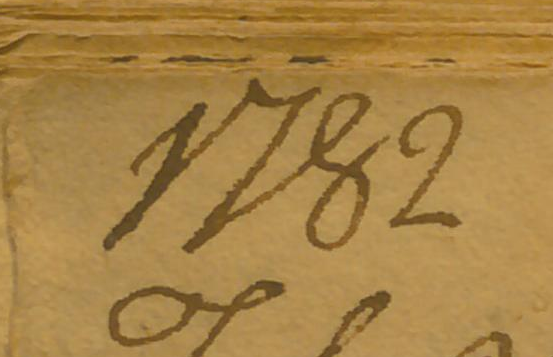1782
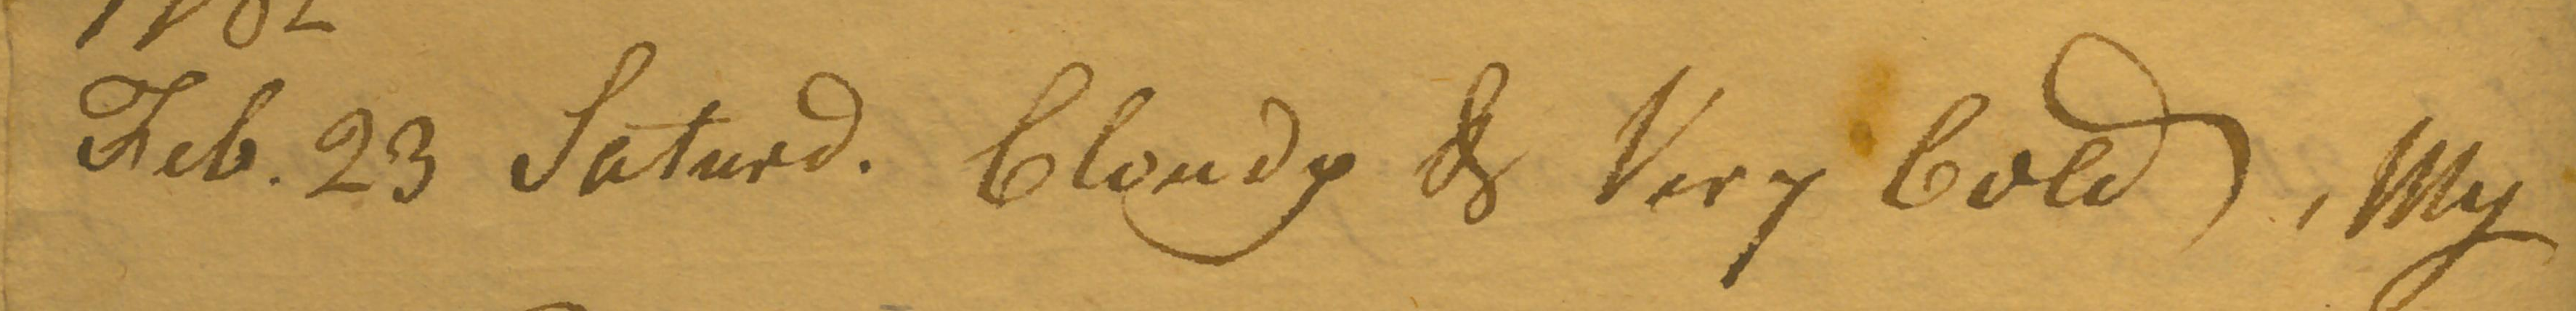Feb. 23 Saturd. Cloudy & Very Cold. My
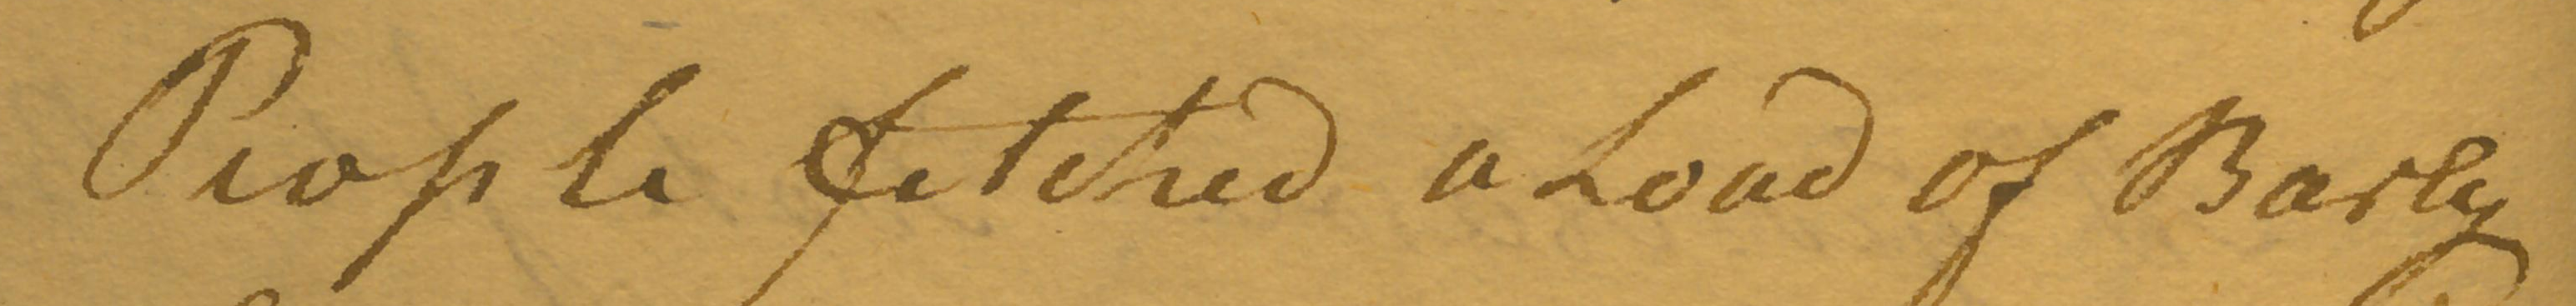People fetched a Load of Barly
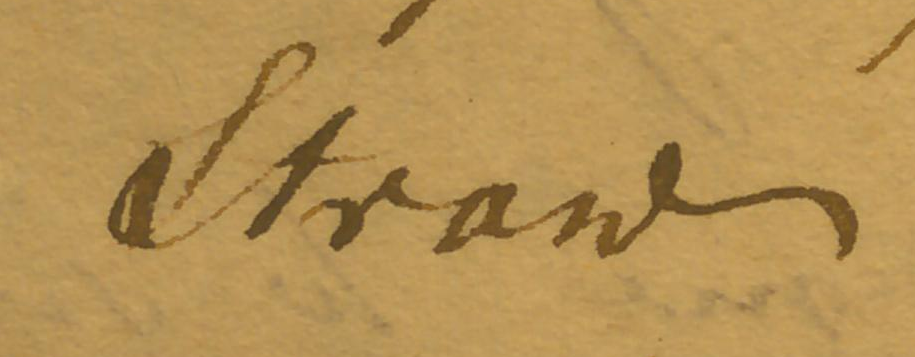Straw
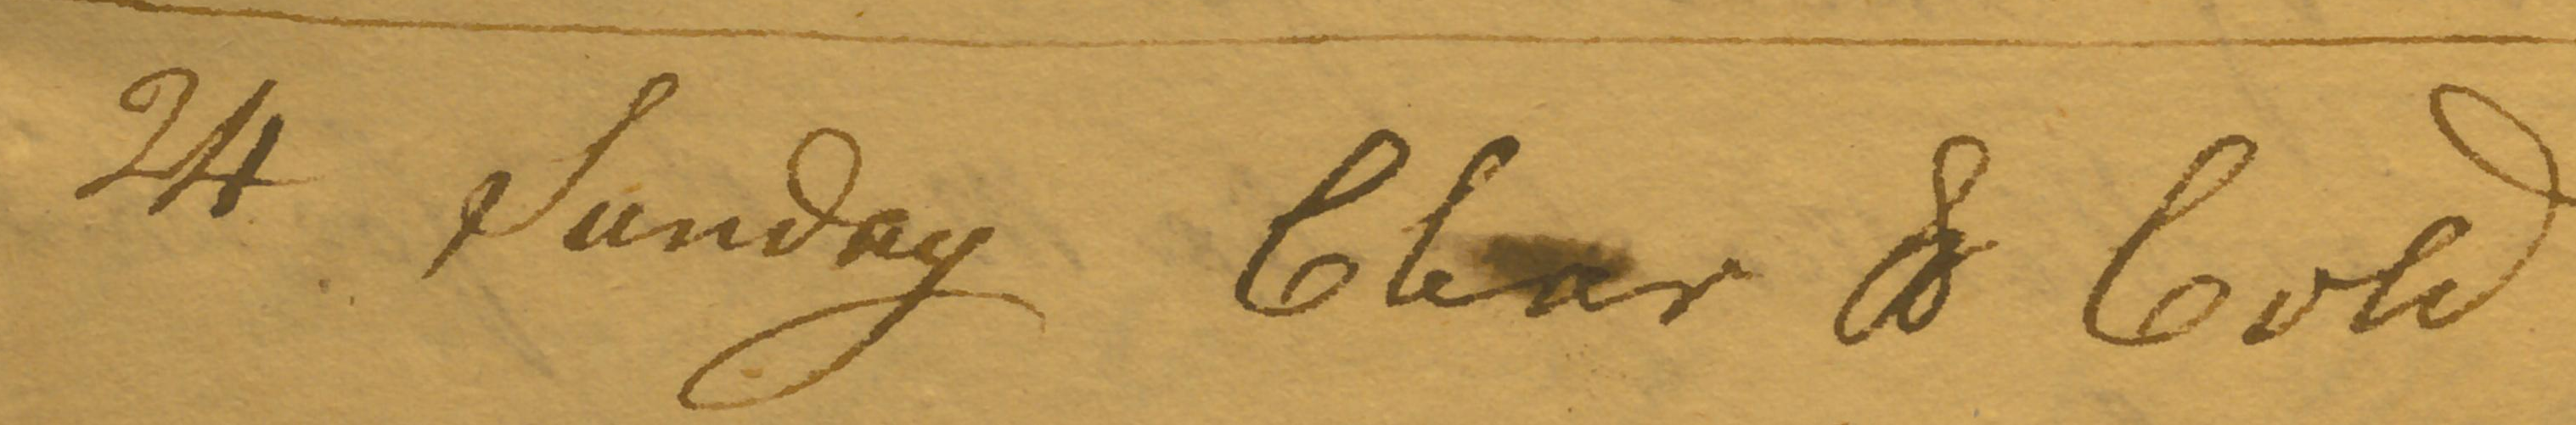24 Sunday Clear & Cold
